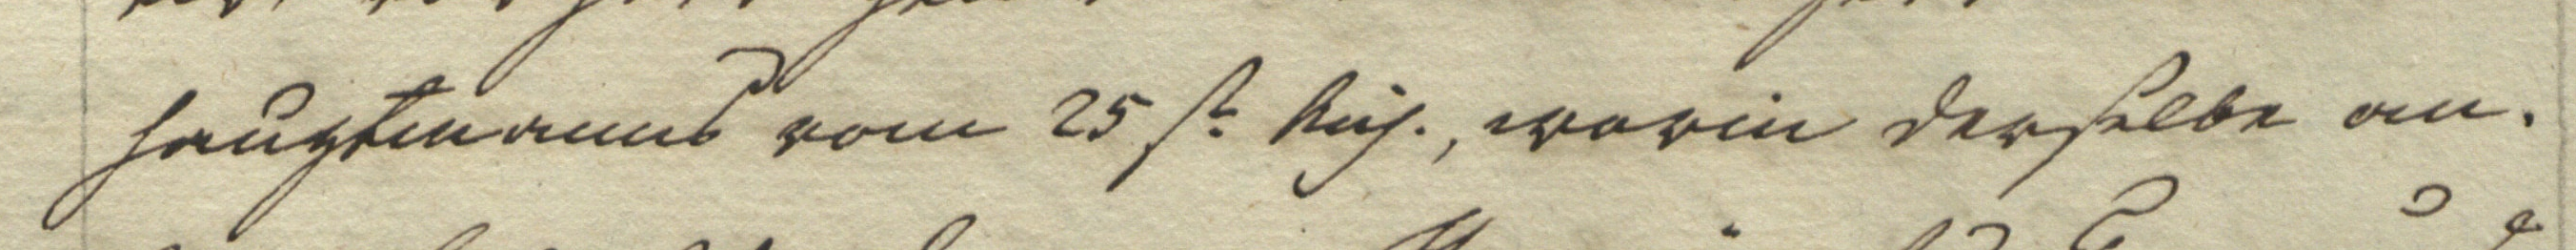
hauptmanns vom 25 st huj., worin derselbe an¬
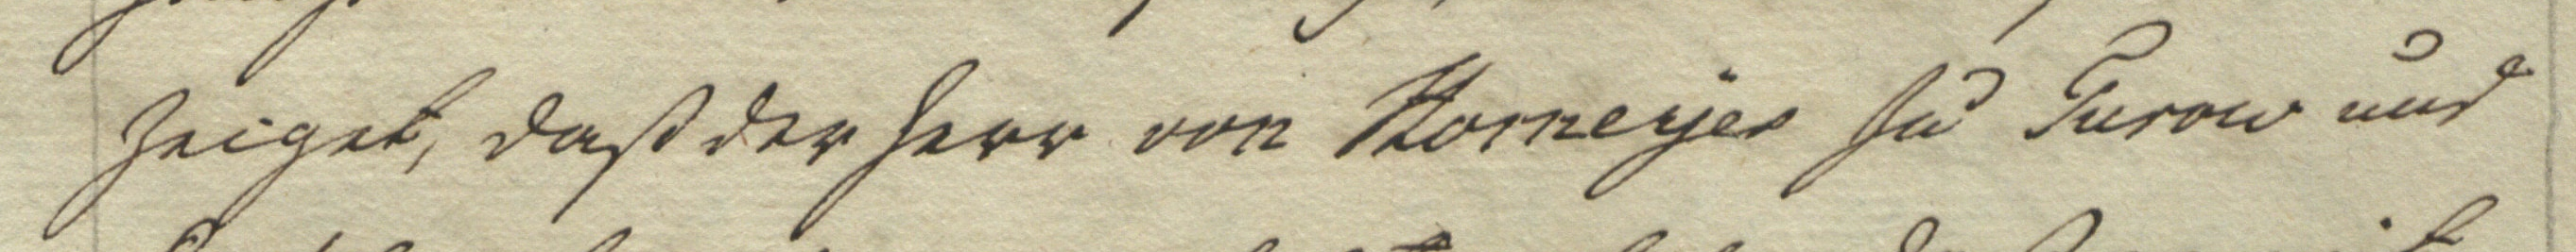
zeiget, daß der Herr von Homeÿer zu Turow und
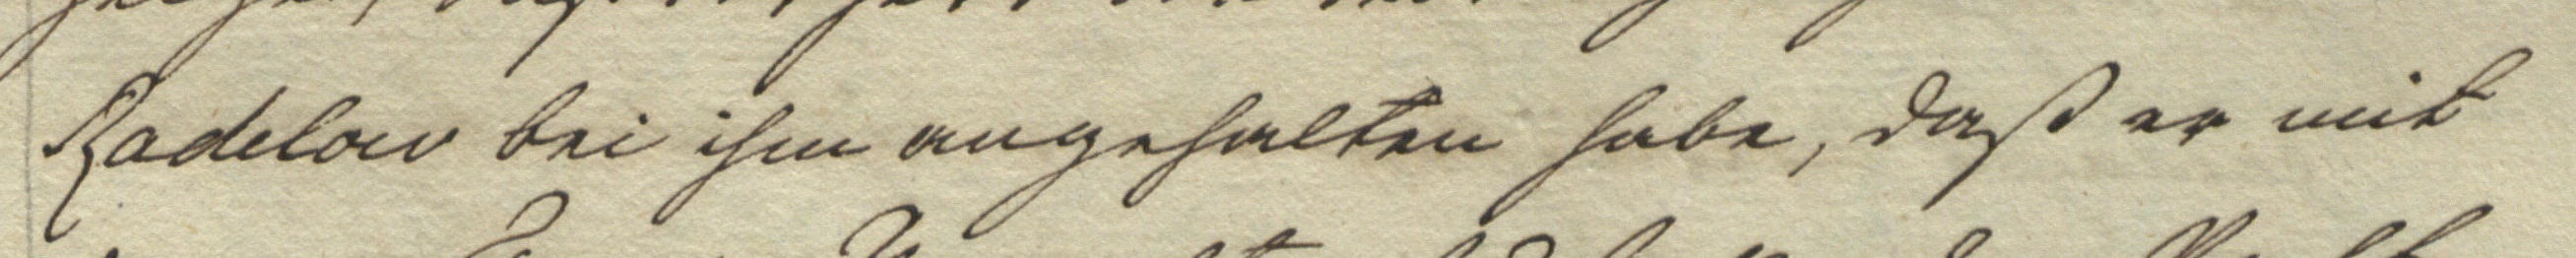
Radelow bei ihm angehalten habe, daß er mit
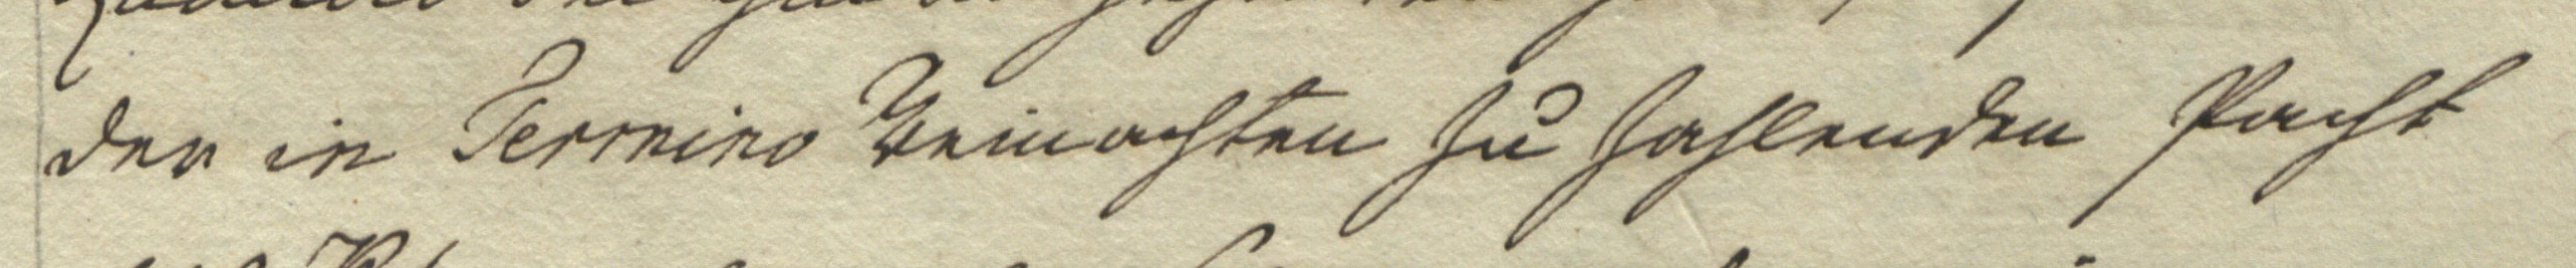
der in Termino Weinachten zu zahlenden Pacht
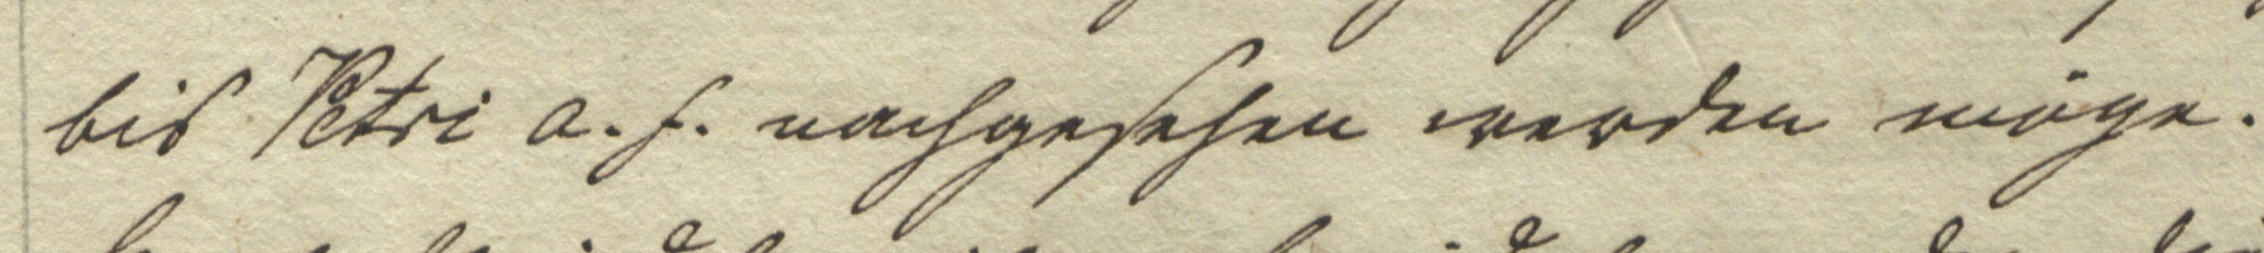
bis Petri a. f. nachgesehen werden möge.
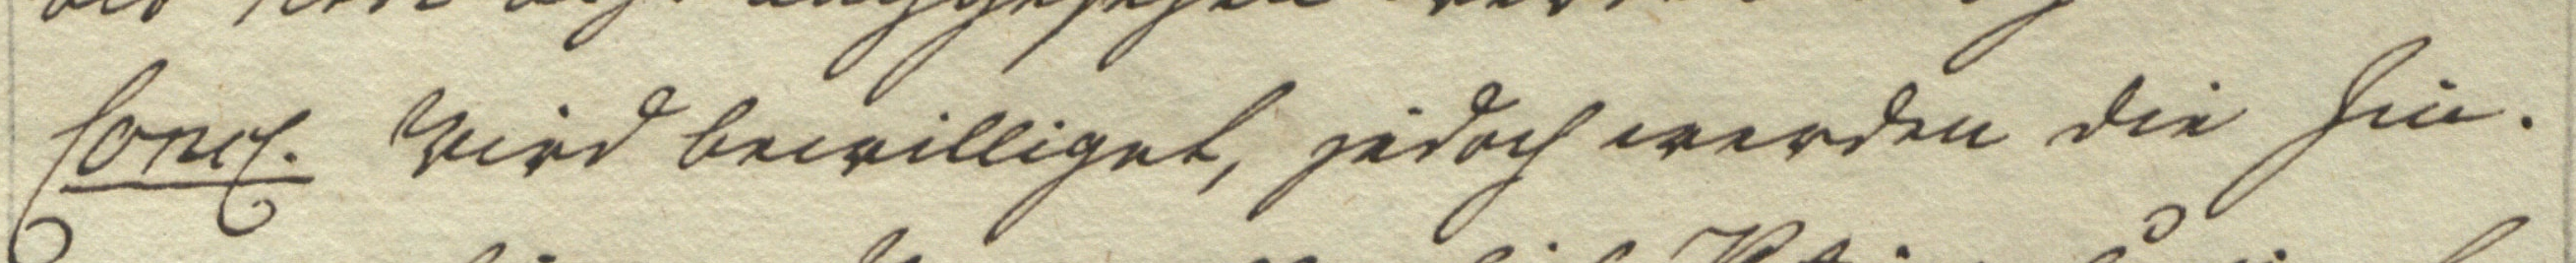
Concl. Wird bewilliget, jedoch werden die Zin¬
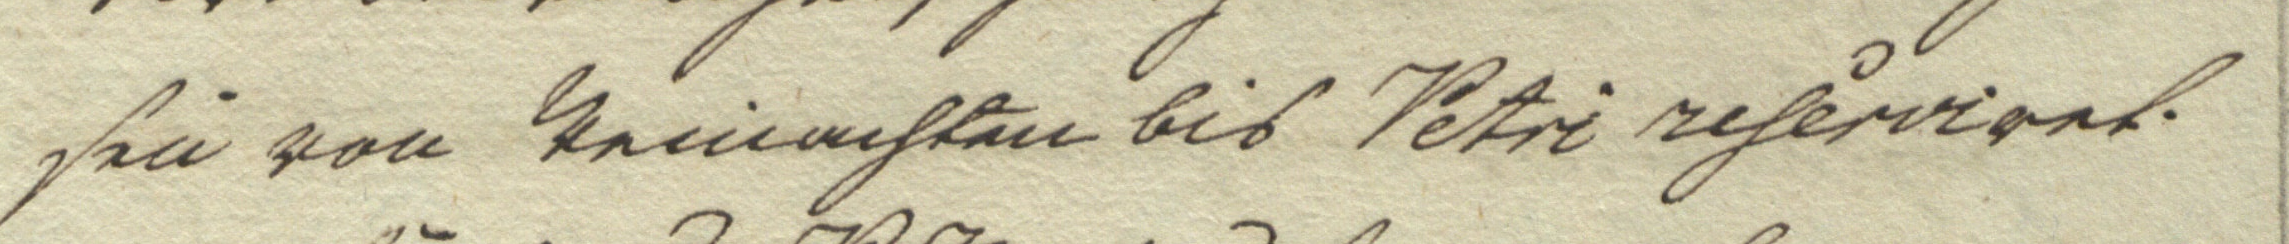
sen von Weinachten bis Petri reserviret.
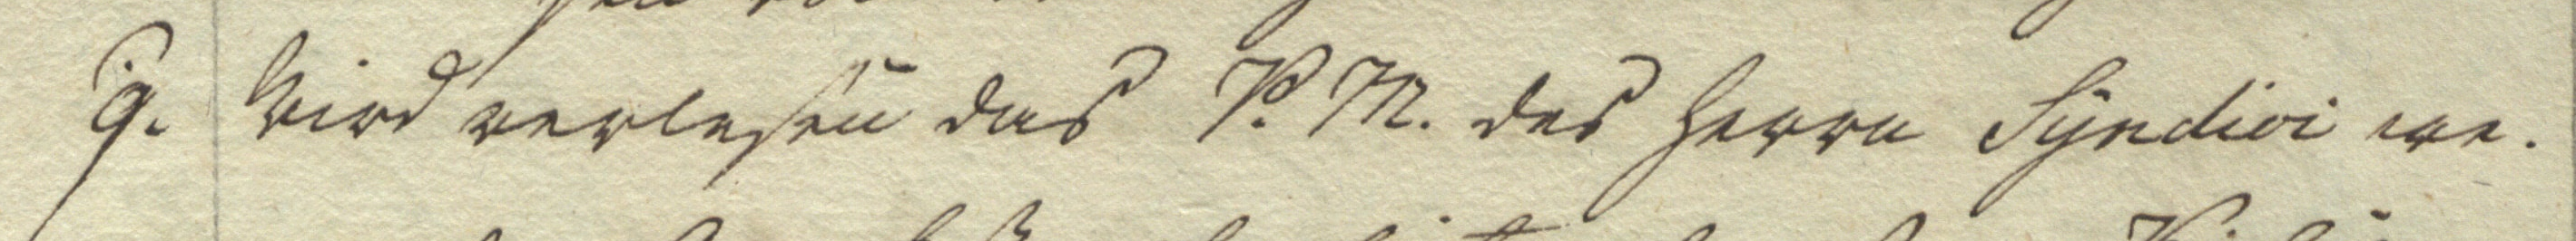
9. Wird verlesen das P. M. des Herrn Sÿndici we¬
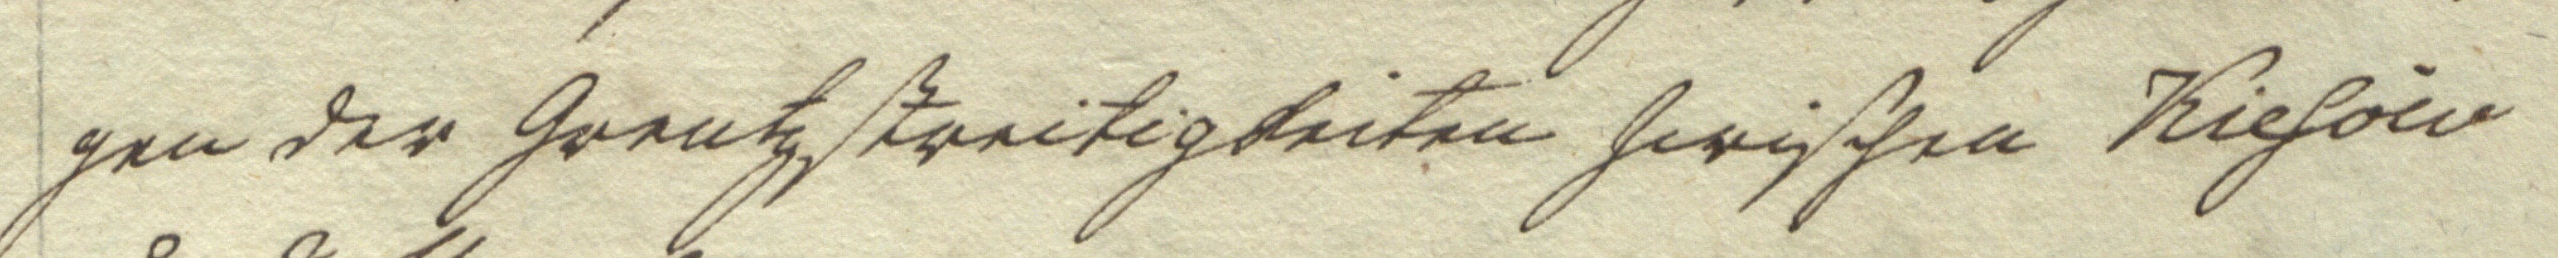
gen der Grentzstreitigkeiten zwischen Kiesow
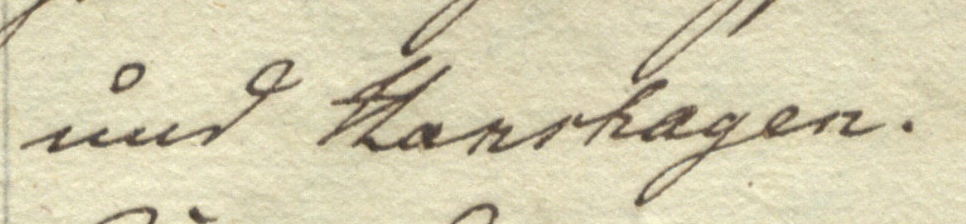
und Hanshagen.
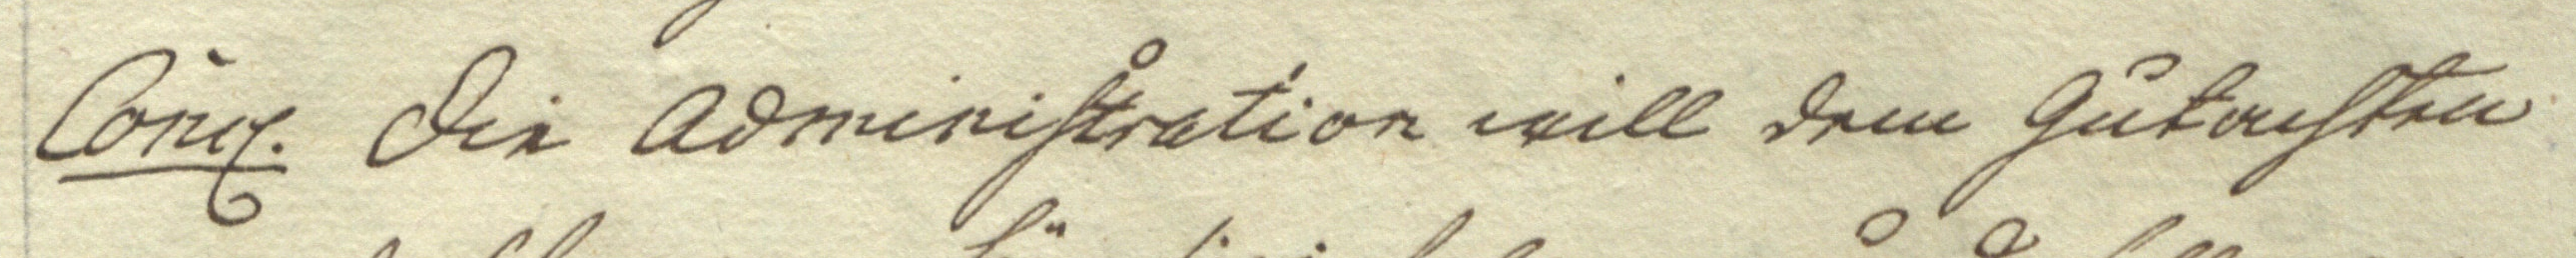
Concl. Die Administration will dem Gutachten
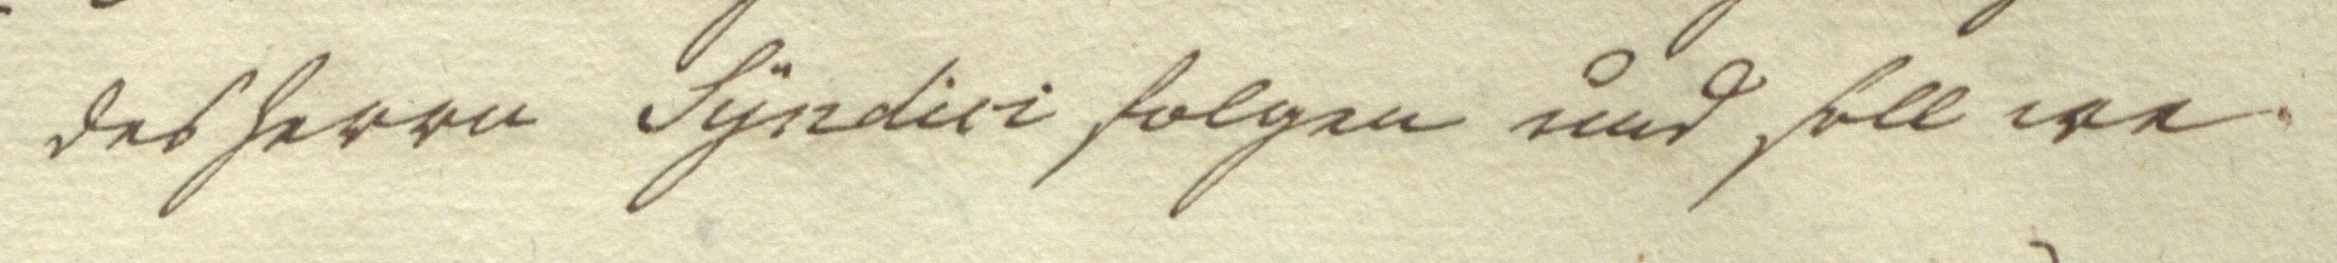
des Herrn Sÿndici folgen und soll we¬
